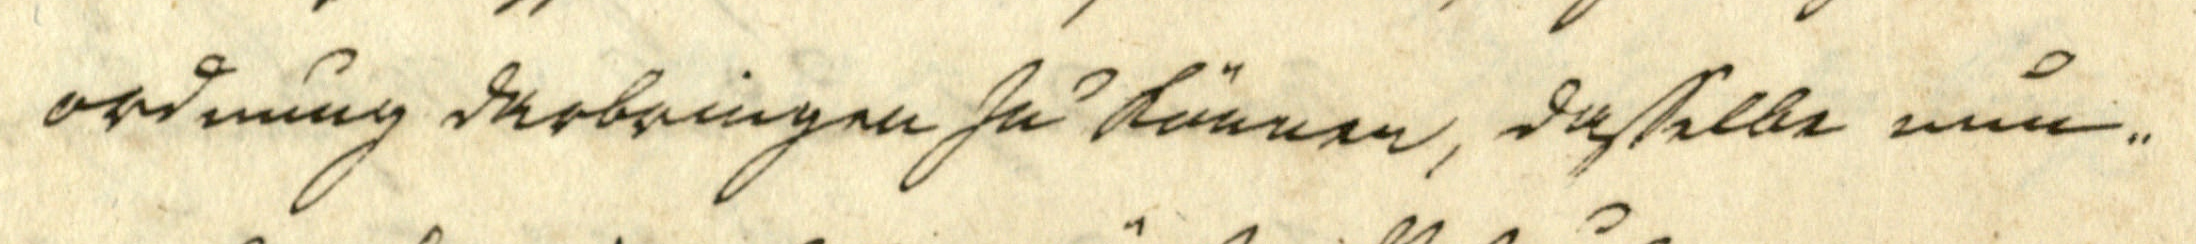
ordnung darbringen zu können, dasselbe nun¬
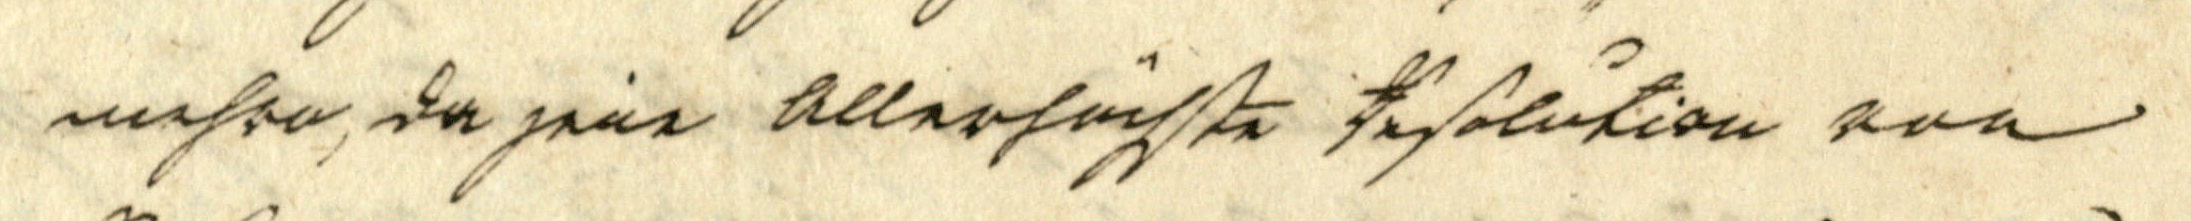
mehro, da jene Allerhöchste Resolution von
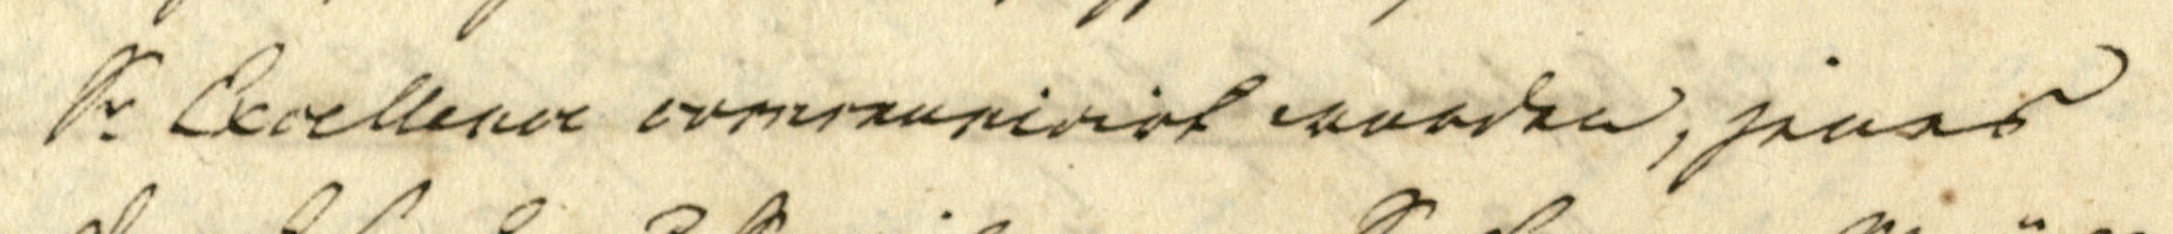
Sr Excellence communicirt worden, jenes
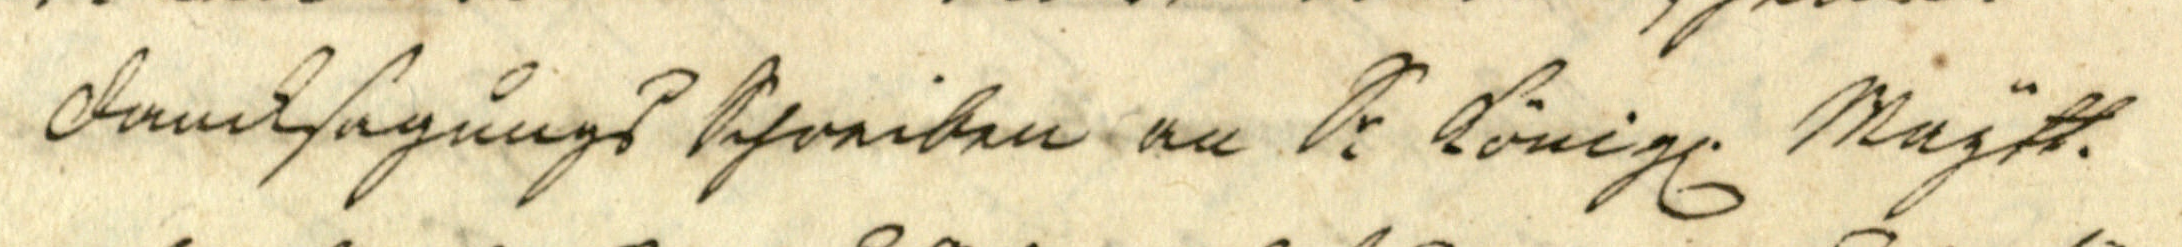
Dancksagungs Schreiben an Sr Königl. Maÿtt.
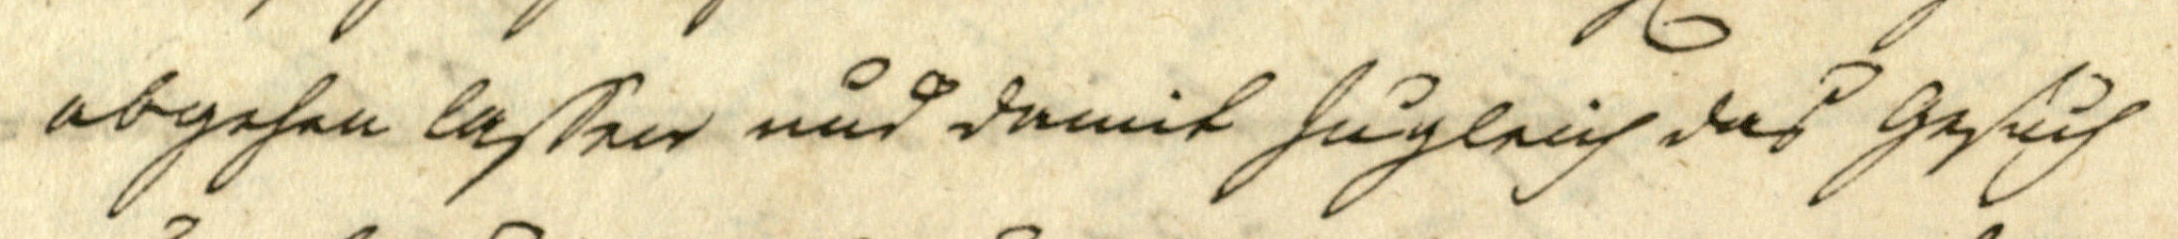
abgehen lassen und damit zugleich das Gesuch
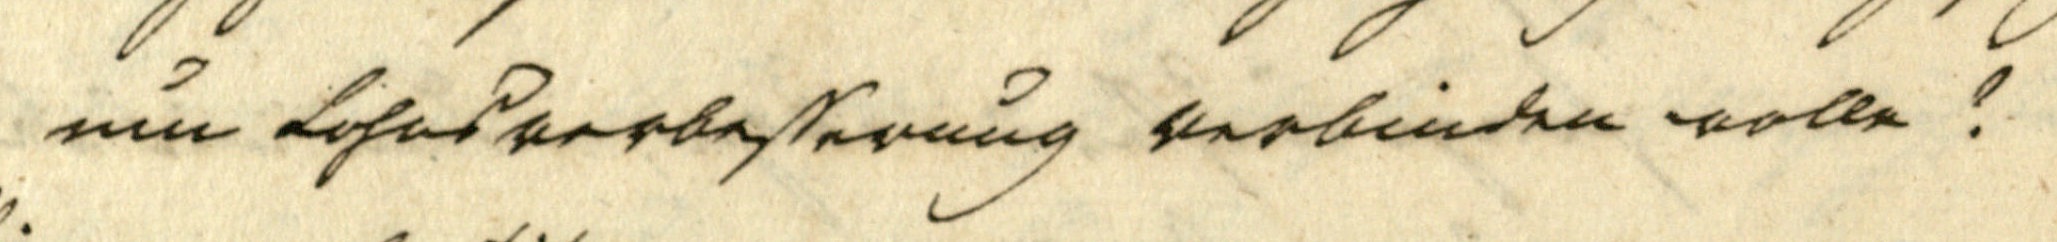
um LohnsVerbesserung verbinden wolle?
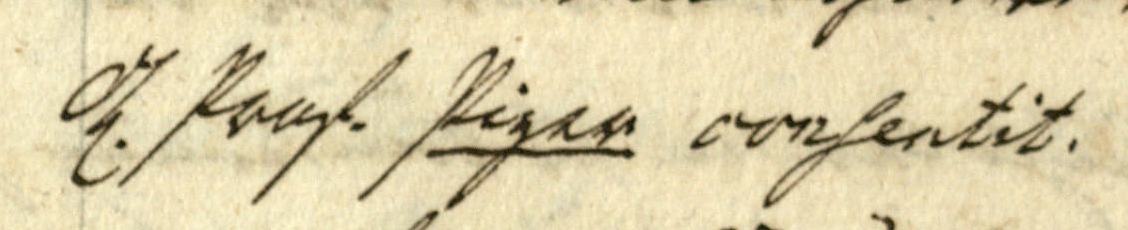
dh. Prof. Piper consentit.
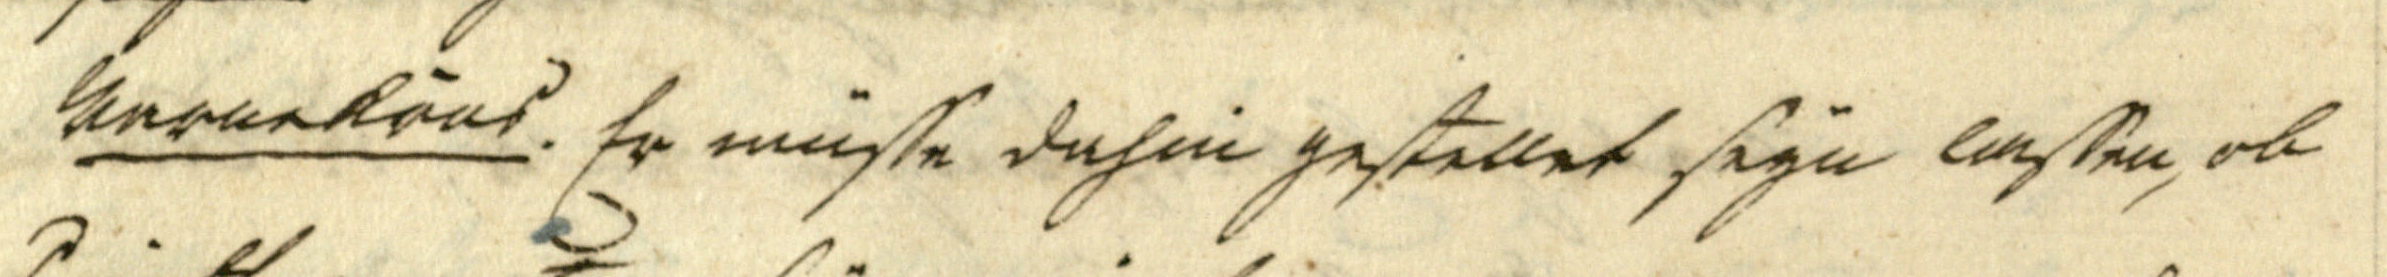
Warnekros. Er müsse dahin gestellet seÿn lassen, ob
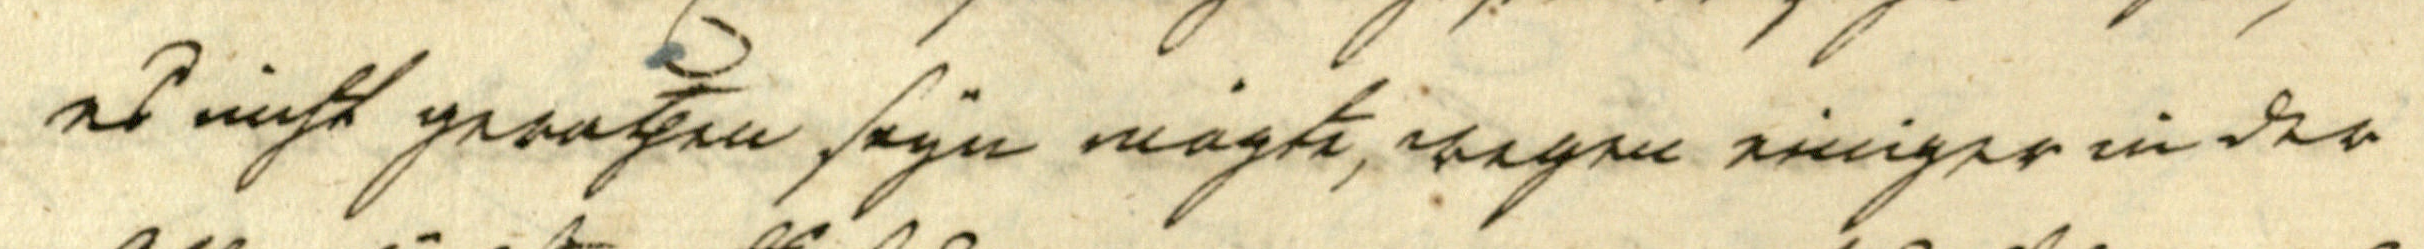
es nicht gerathen seÿn mögte, wegen einiger in der
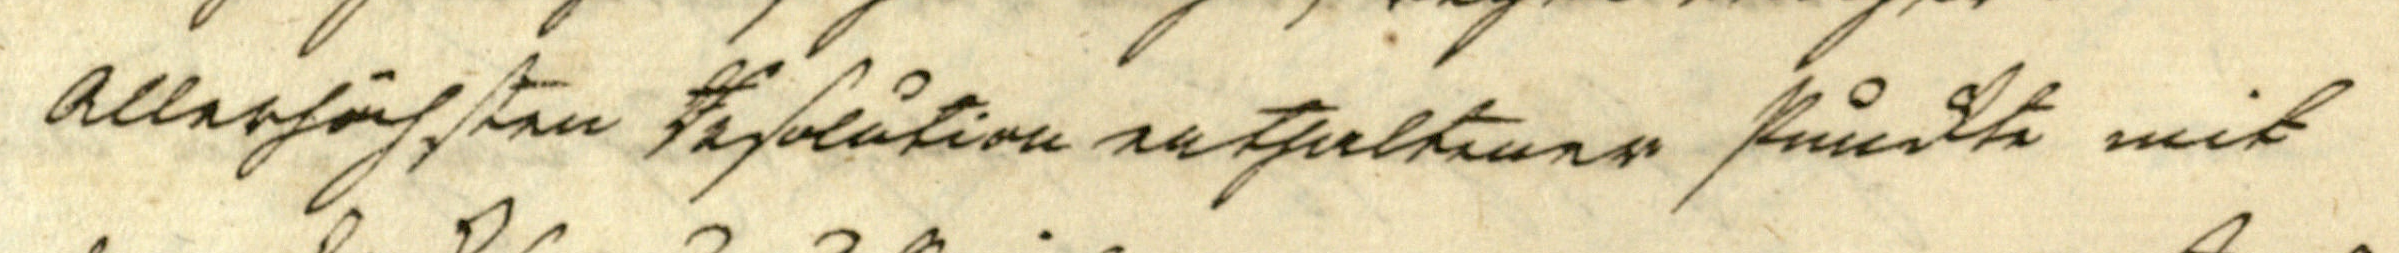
Allerhöchsten Resolution enthaltener Punckte mit
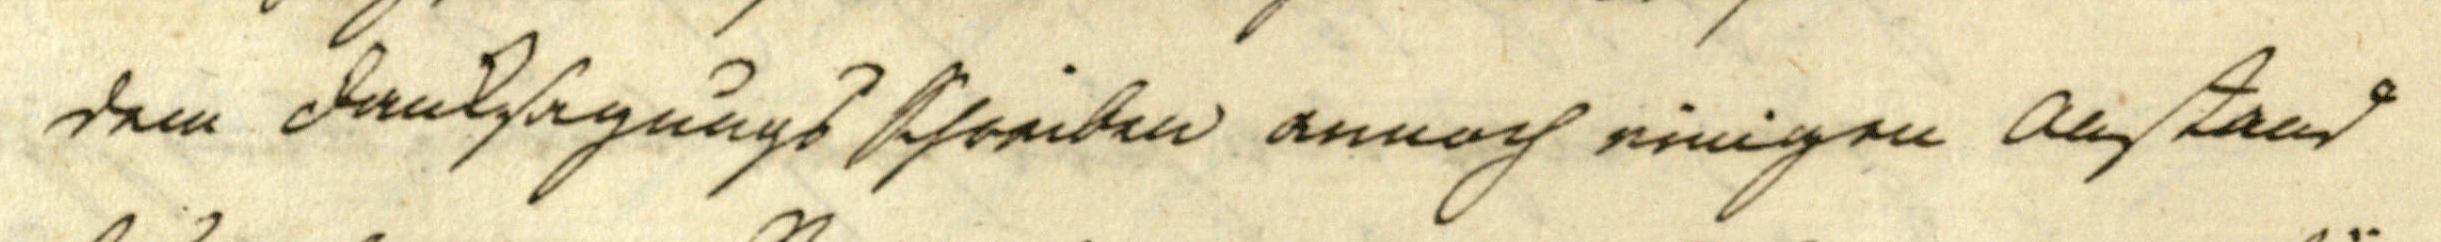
dem Danksagungs Schreiben annoch einigen Anstand
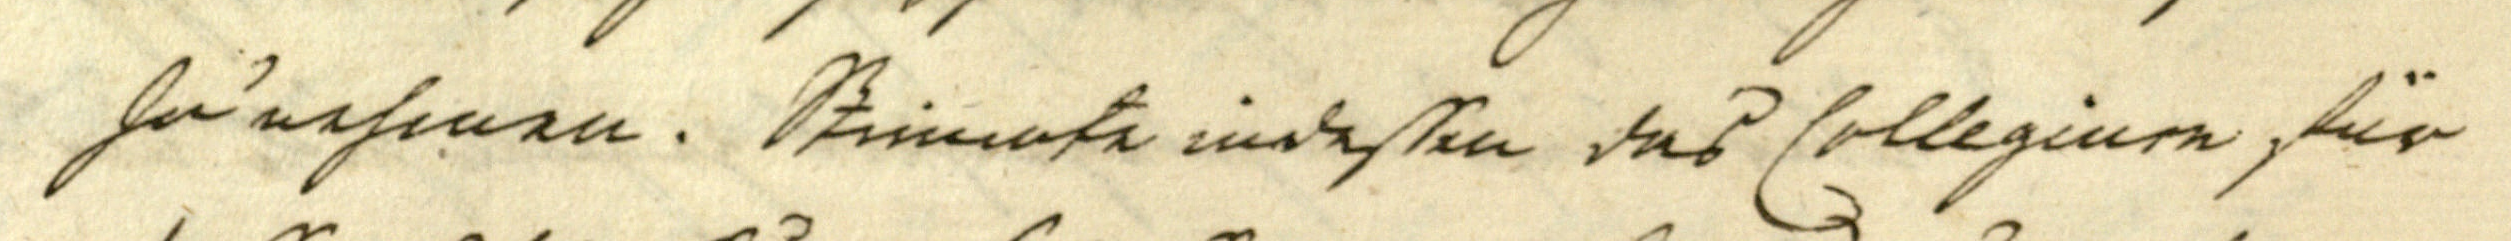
zu nehmen. Stimmte indessen das Collegium für
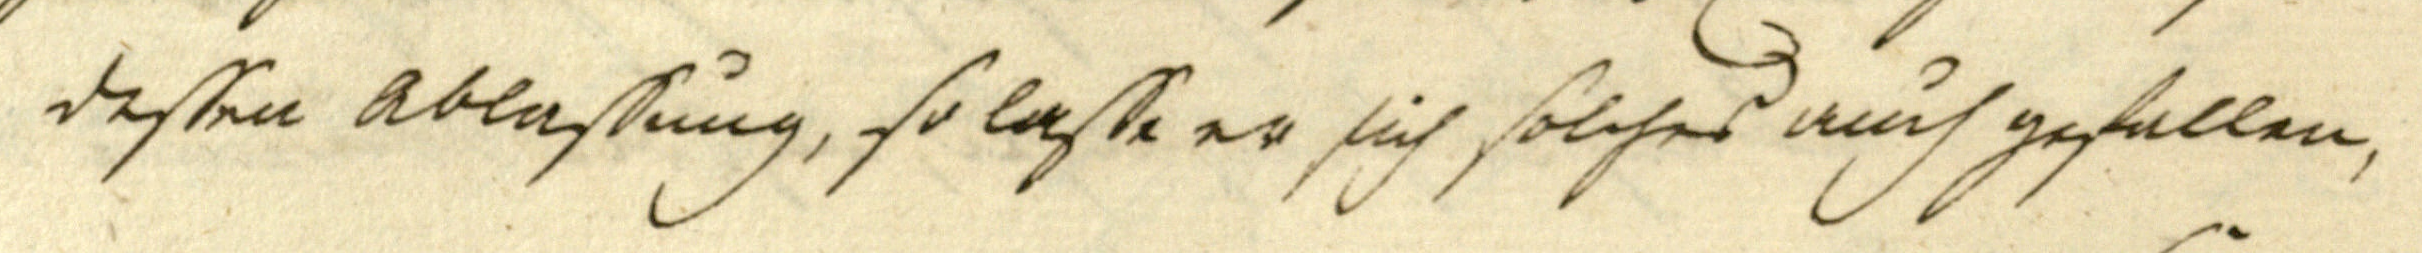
dessen Ablassung, so lasse er sich solches auch gefallen,
